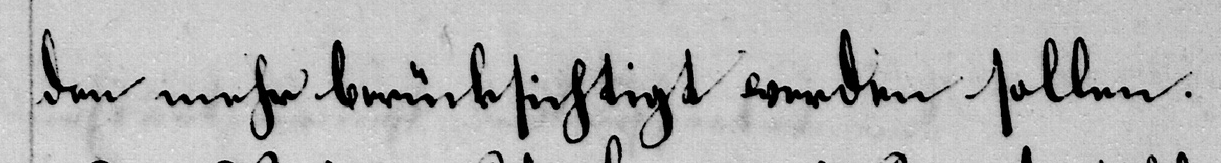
den mehr berücksichtigt werden sollen.
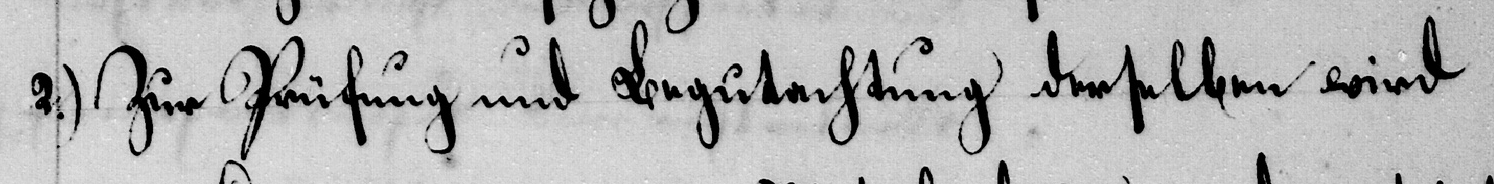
2.) Zur Prüfung und Begutachtung derselben wird
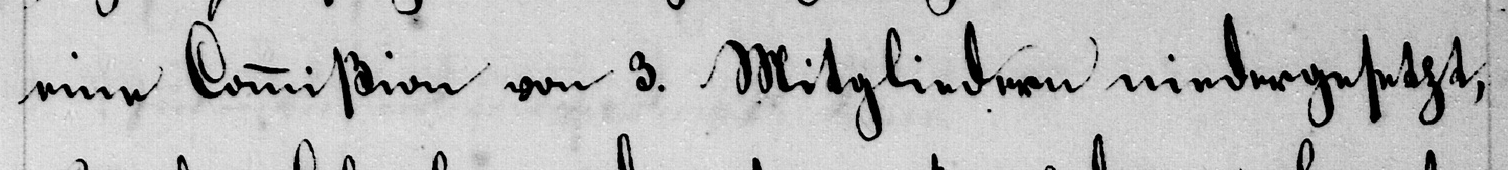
eine Commißion von 3. Mitgliedern niedergesetzt,
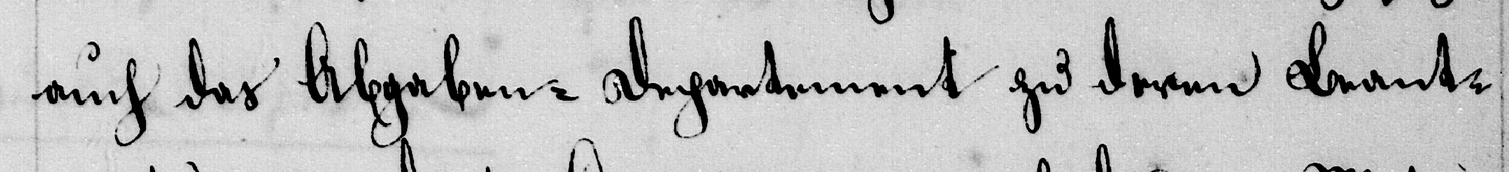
auch das Abgaben-Departement zu deren Beant¬
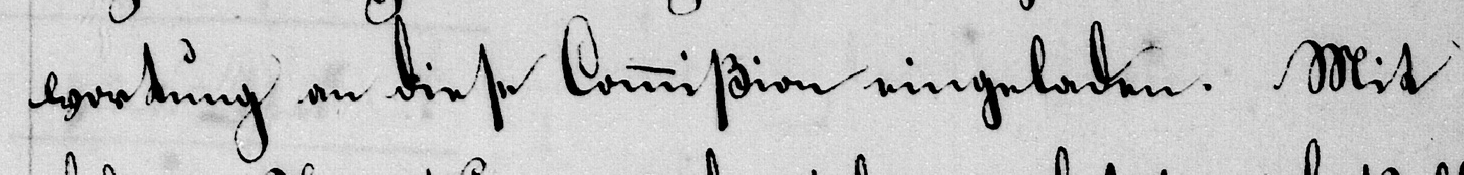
wortung an diese Commißion eingeladen. Mit
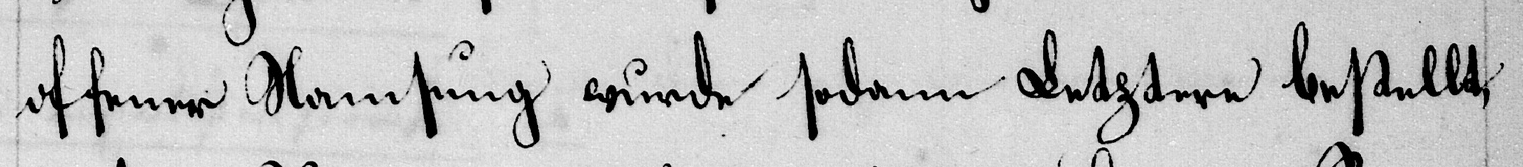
offener Namsung wurde sodann Letztere bestellt,
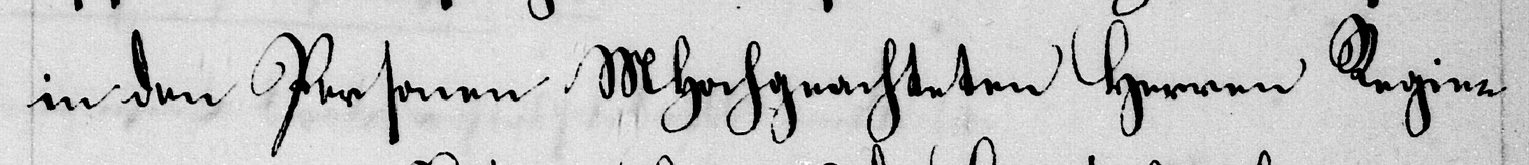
in den Personen MHochgeachteten Herren Regie¬
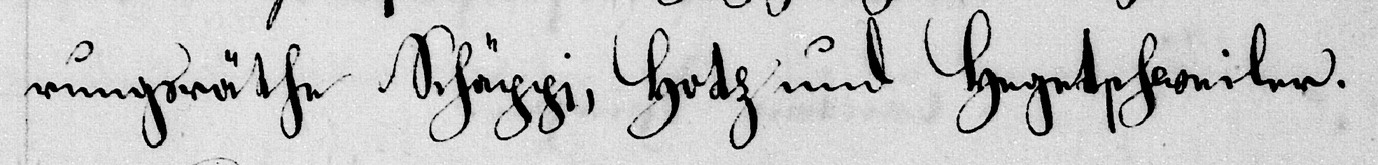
rungsräthe Schäppi, Hotz und Hegetschweiler.
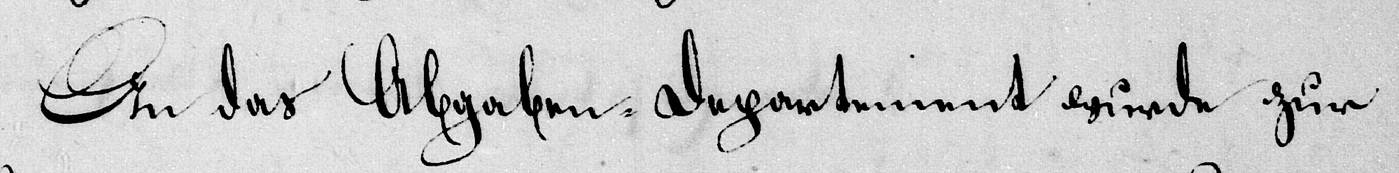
An das Abgaben Departement wurde zur
